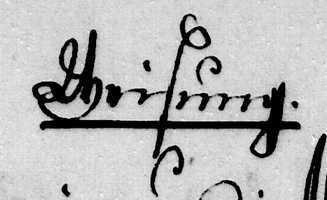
Weisung.
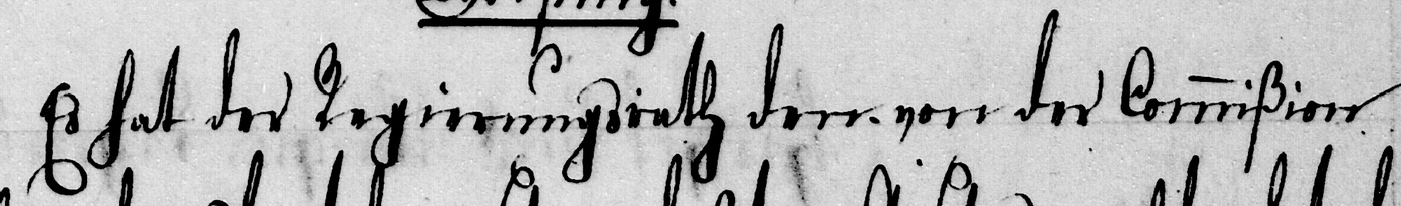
Es hat der Regierungsrath den von der Commißion
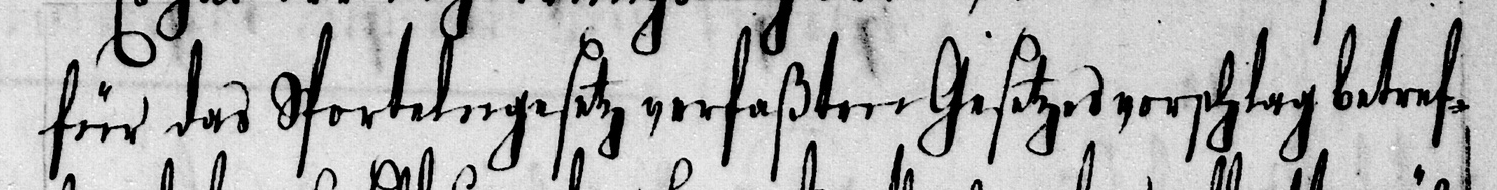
für das Sportelngesetz verfaßten Gesetzesvorschlag betref¬
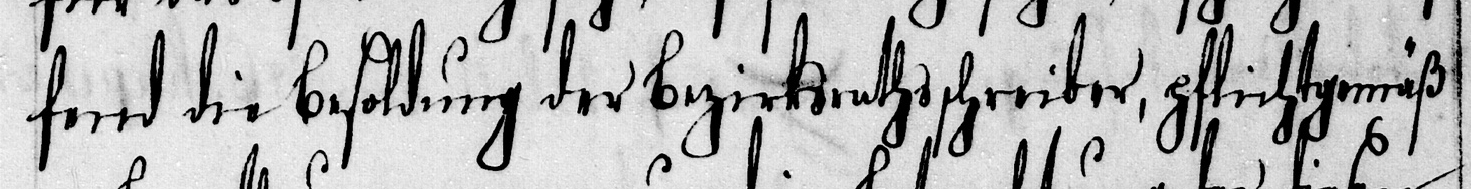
fend die Besoldung der Bezirksrathsschreiber,
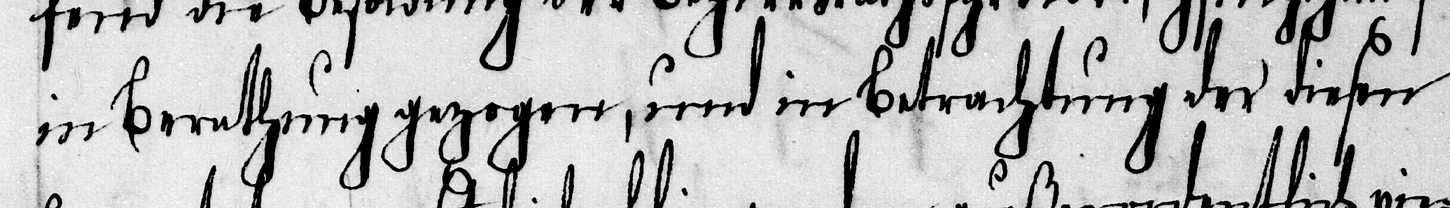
in Berathung gezogen, und in Betrachtung der diesen
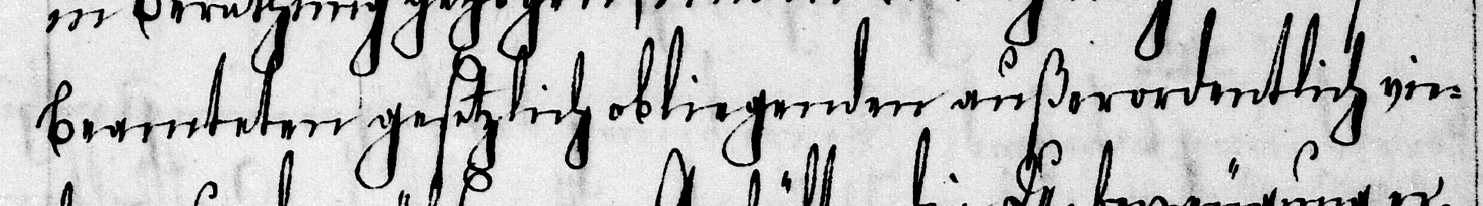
Beamteten gesetzlich obliegenden außerordentlich vie¬
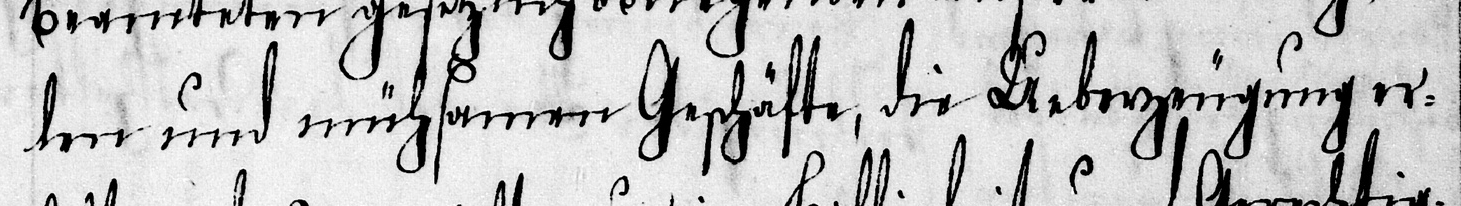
len und mühsamen Geschäfte, die Ueberzeugung er¬
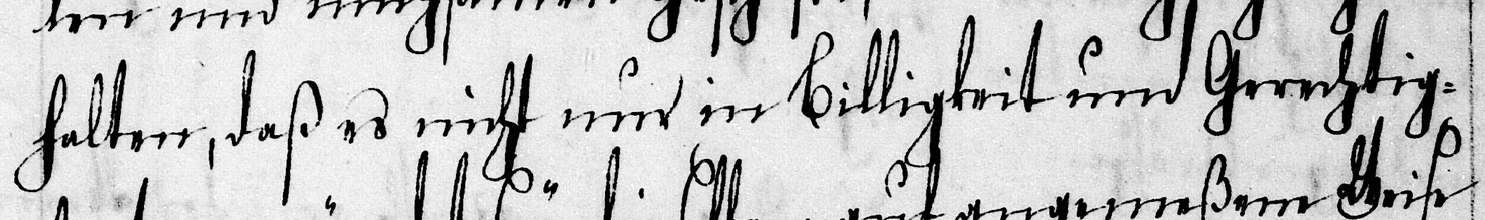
halten, daß es nicht nur in Billigkeit und Gerechtig¬
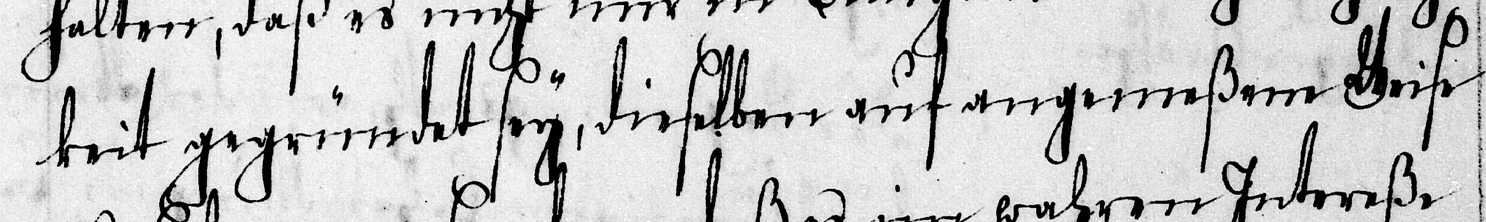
keit gegründet sey, dieselben auf angemeßene Weise
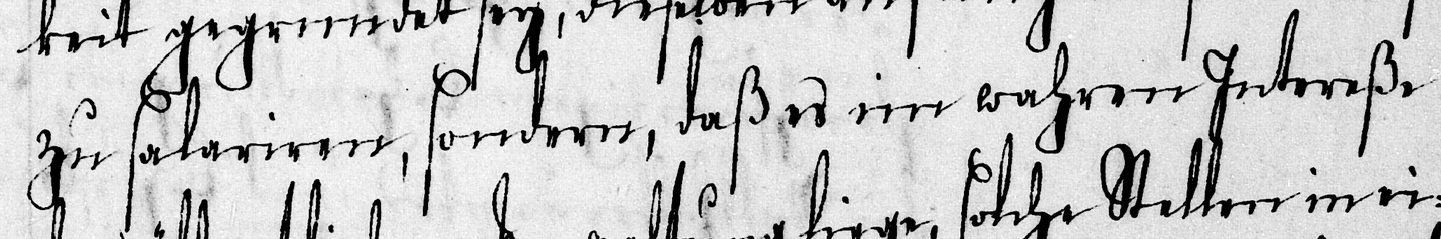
zu salariren, sondern, daß es im wahren Intereße
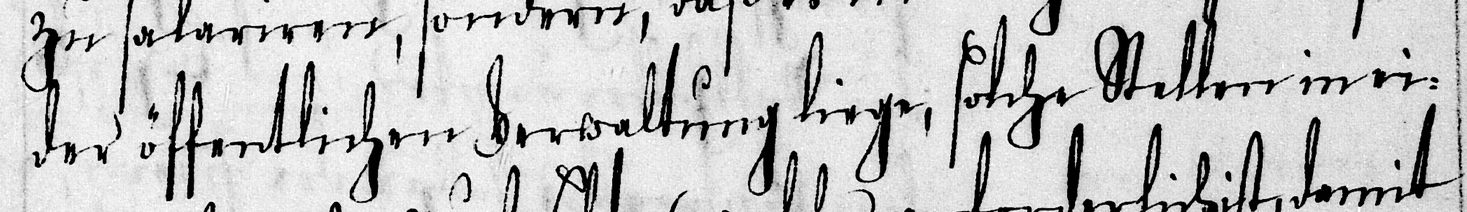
der öffentlichen Verwaltung liege, solche Stellen in ei¬
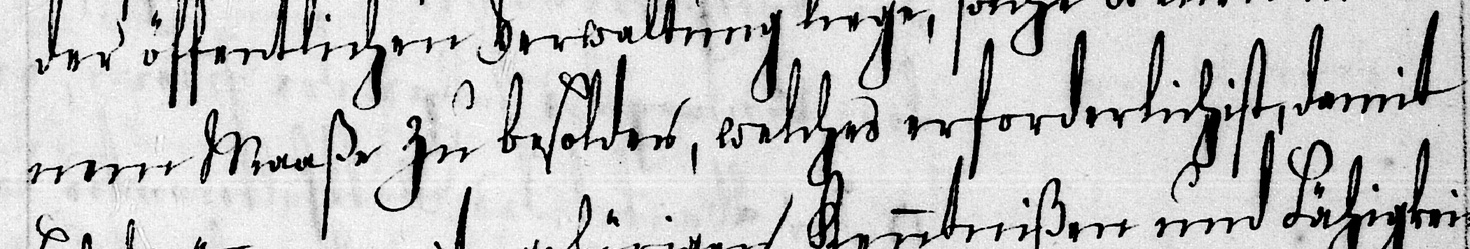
nem Maaße zu besolden, welches erforderlich ist, damit
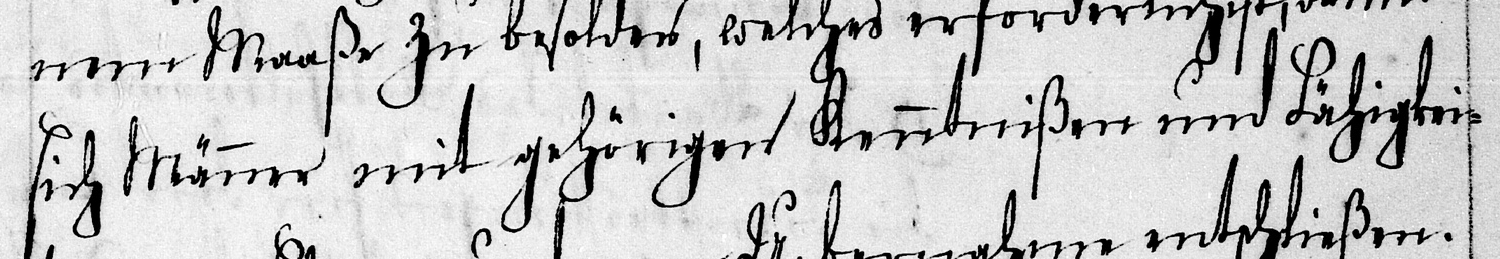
sich Männer mit gehörigen Kenntnißen und Fähigkei¬
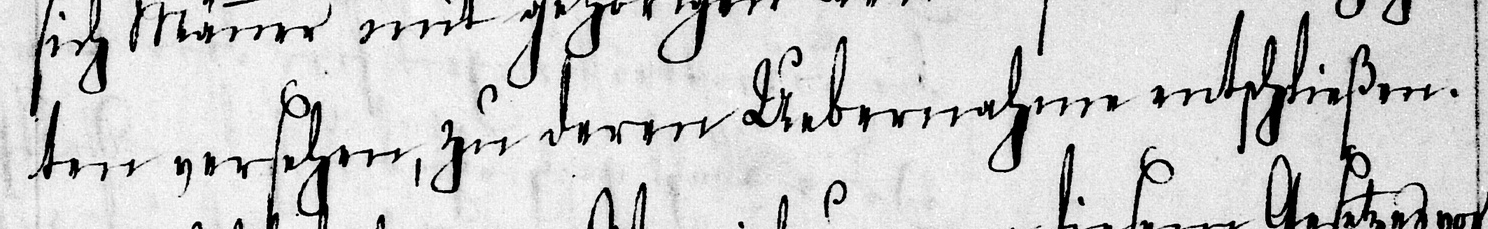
ten versehen, zu deren Uebernahme entschließen.
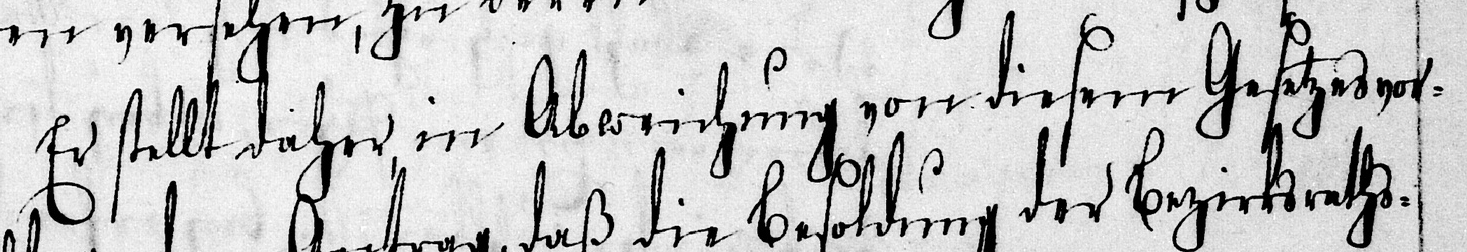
Er stellt daher in Abweichung von diesem Gesetzesvor¬
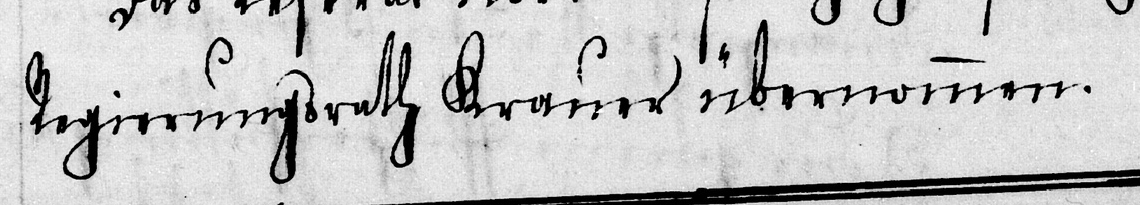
Regierungsrath Krauer übernommen.
